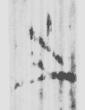之
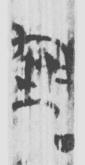均
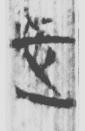正
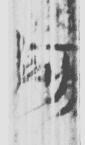所
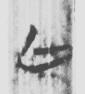㠯（以）
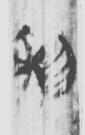利
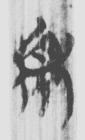{頁从}
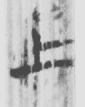上
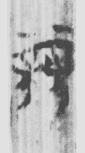辡
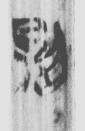則
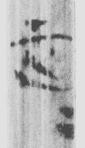正=
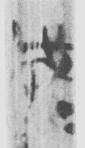成=
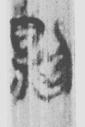則
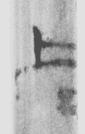上=
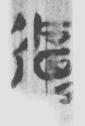{彳亘}=
